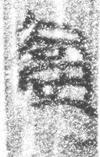盍（蓋）
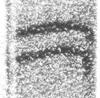二
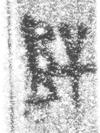釬
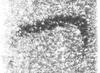一
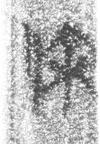浍（沬）
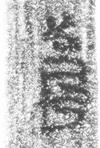○（盤）
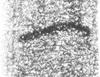一
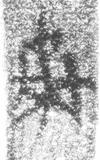○（承）
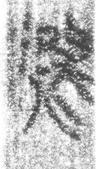○（燭）
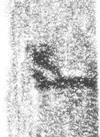之
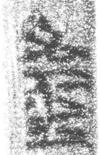○（盤）
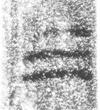三
